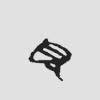見
